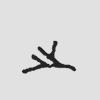出
